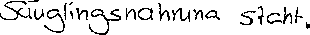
Säuglingsnahrung steht
